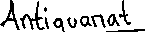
Antiquariat
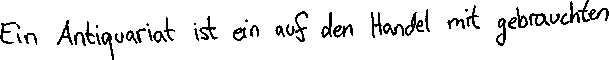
Ein Antiquariat ist ein auf den Handel mit gebrauchten
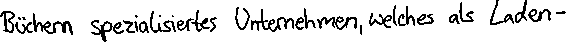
Büchern spezialisiertes Unternehmen, welches als Laden-
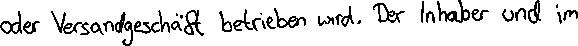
oder Versandgeschäft betrieben wird. Der Inhaber und im
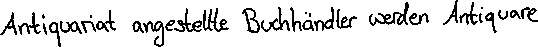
Antiquariat angestellte Buchhändler werden Antiquare
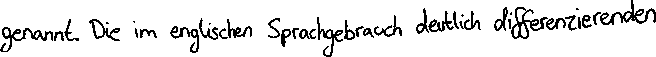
genannt. Die im englischen Sprachgebrauch deutlich differenzierenden
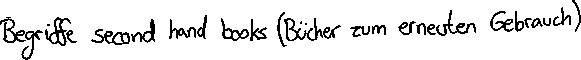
Begriffe second hand books (Bücher zum erneuten Gebrauch)
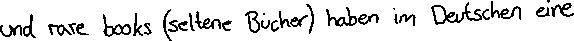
und rare books (seltene Bücher) haben im Deutschen eine
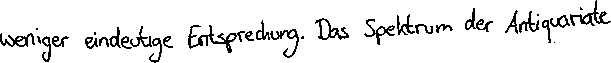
weniger eindeutige Entsprechung. Das Spektrum der Antiquariate
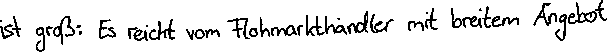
ist groß: Es reicht vom Flohmarkthändler mit breitem Angebot
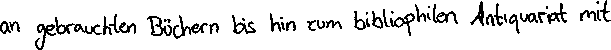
an gebrauchten Büchern bis hin zum bibliophilen Antiquariat mit
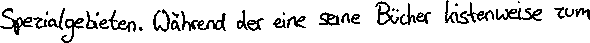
Spezialgebieten. Während der eine seine Bücher kistenweise zum
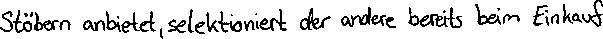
Stöbern anbietet, selektioniert der andere bereits beim Einkauf
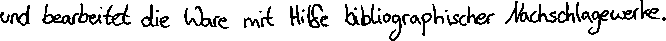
und bearbeitet die Ware mit Hilfe bibliographischer Nachschlagewerke.
